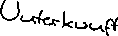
Unterkunft
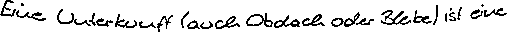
Eine Unterkunft (auch Obdach oder Bleibe) ist eine
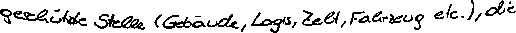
geschützte Stelle (Gebäude, Logis, Zelt, Fahrzeug etc.), die
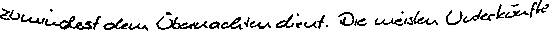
zumindest dem Übernachten dient. Die meisten Unterkünfte
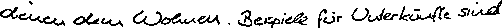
dienen dem Wohnen. Beispiele für Unterkünfte sind
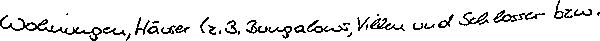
Wohnungen, Häuser (z. B. Bungalows, Villen und Schlösser bzw.
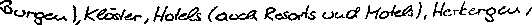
Burgen), Klöster, Hotels (auch Resorts und Motels), Herbergen,
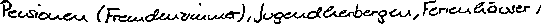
Pensionen (Fremdenzimmer), Jugendherbergen, Ferienhäuser,
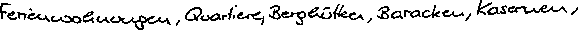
Ferienwohnungen, Quartiere, Berghütten, Baracken, Kasernen,
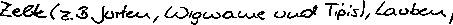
Zelte (z. B. Jurten, Wigwame und Tipis), Lauben,
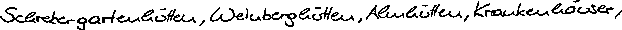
Schrebergartenhütten, Weinberghütten, Almhütten, Krankenhäuser,
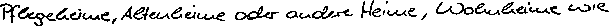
Pflegeheime, Altenheime oder andere Heime, Wohnheime wie
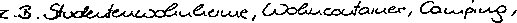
z. B. Studentenwohnheime, Wohncontainer, Camping,
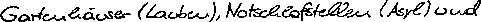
Gartenhäuser (Lauben), Notschlafstellen (Asyl) und
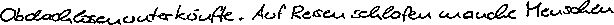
Obdachlosenunterkünfte. Auf Reisen schlafen manche Menschen
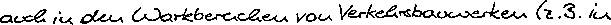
auch in den Wartebereichen von Verkehrsbauwerken (z. B. in
